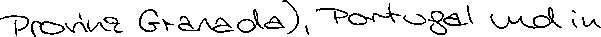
Provinz Granada), Portugal und in
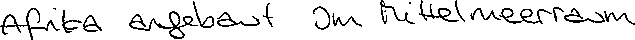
Afrika angebaut. Im Mittelmeerraum
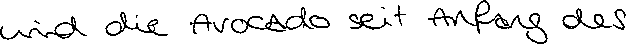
wird die Avocado seit Anfang des
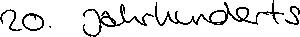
20. Jahrhunderts
